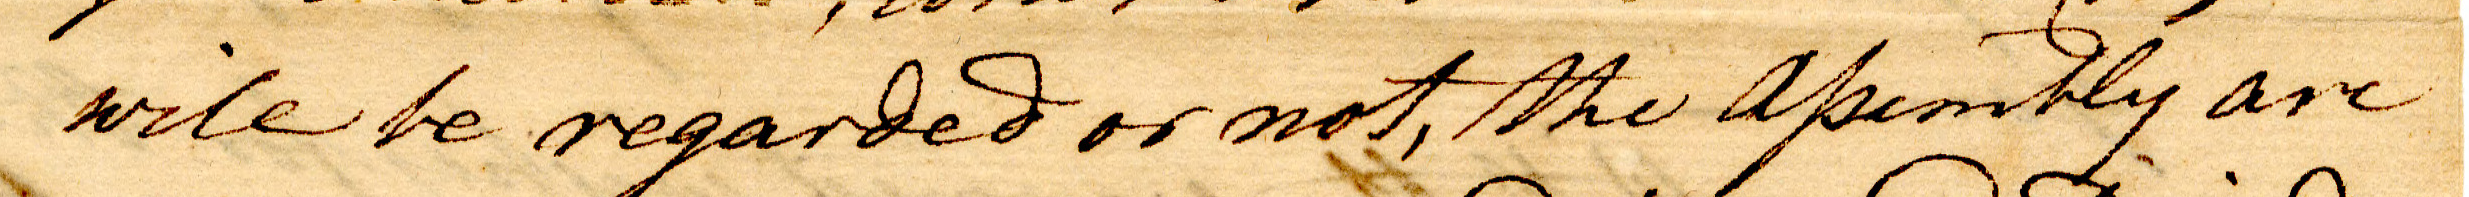will be regarded or not, the Assembly are
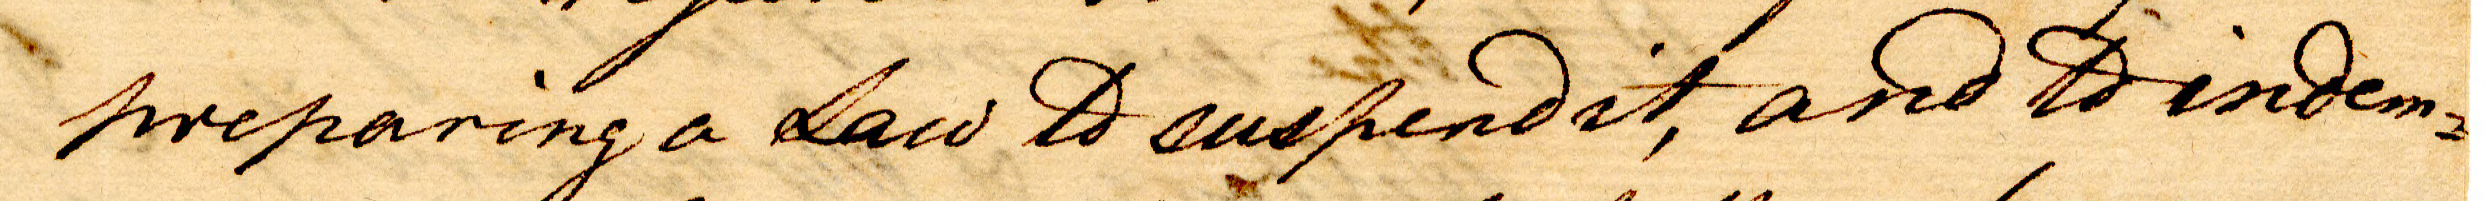preparing a Law to suspend it, and to indem-
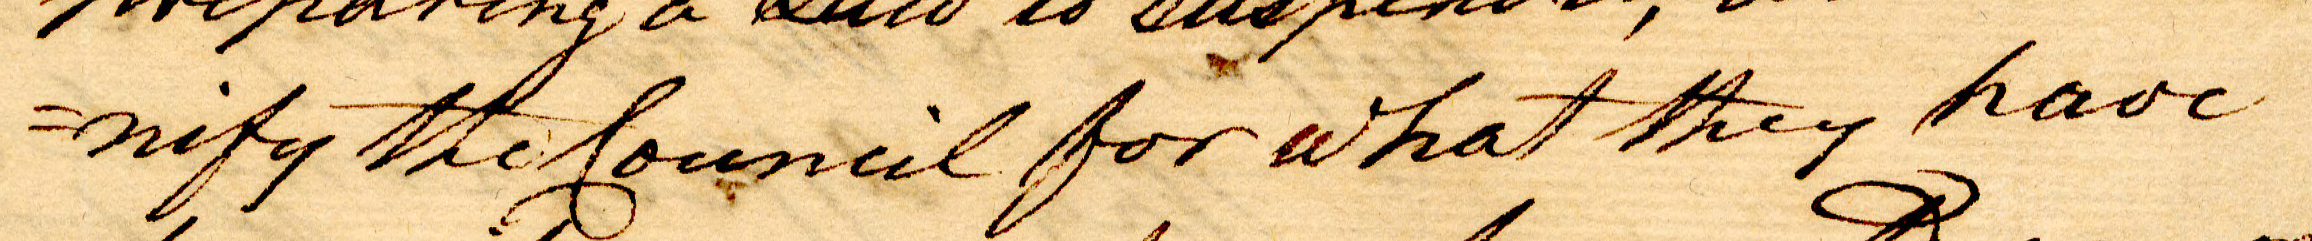-nify the Council for what they have
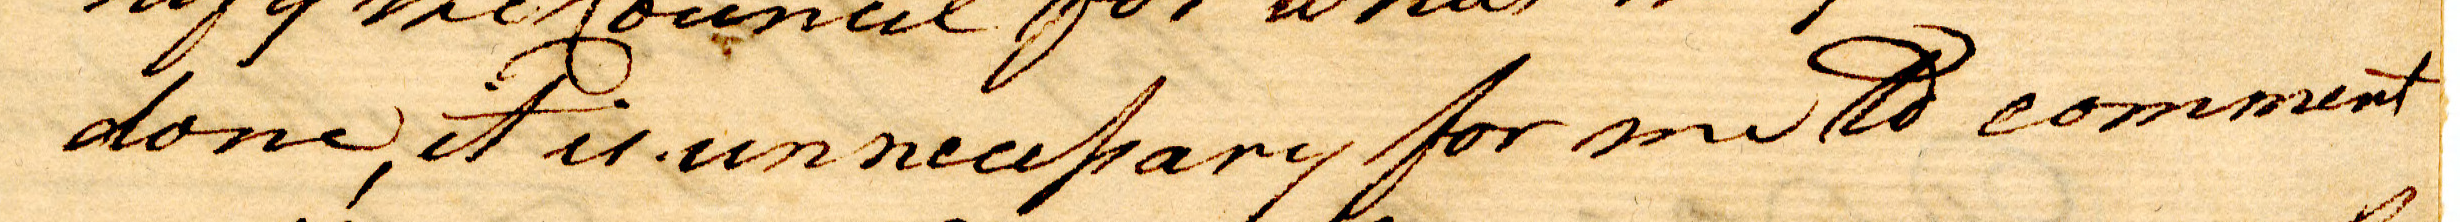done, it is unnecessary for me to comment
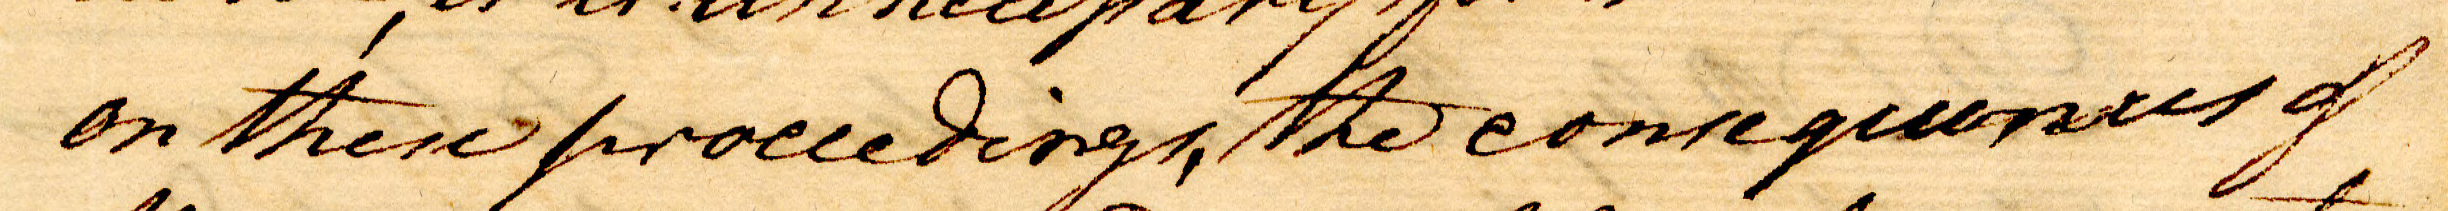on these proceedings, the consequences of
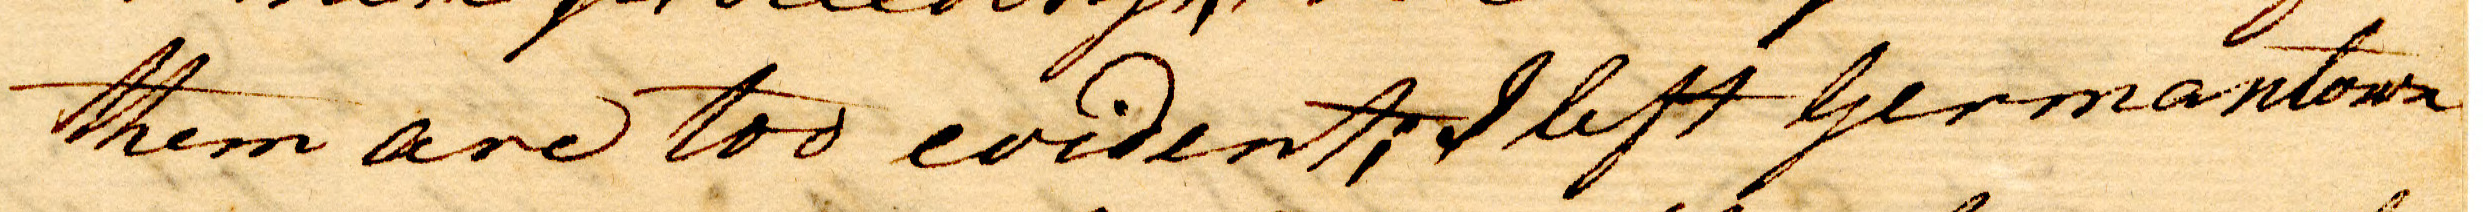them are too evident; I left Germantown
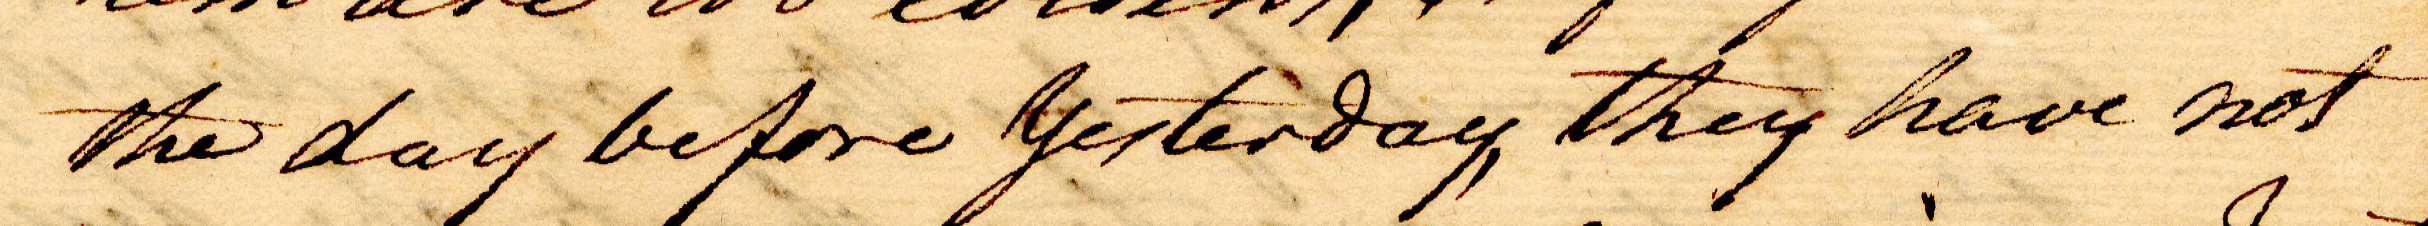the day before Yesterday, they have not
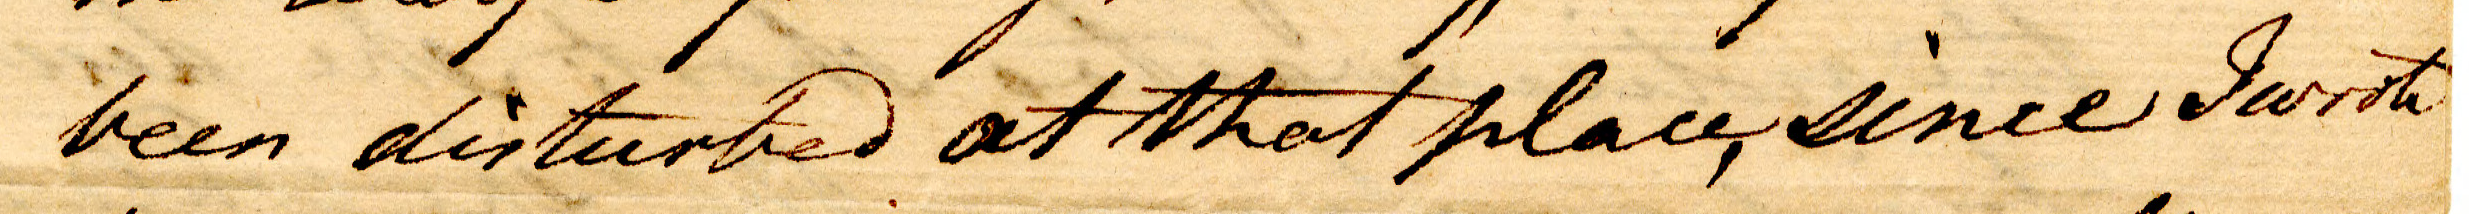been disturbed at that place, since I wrote
